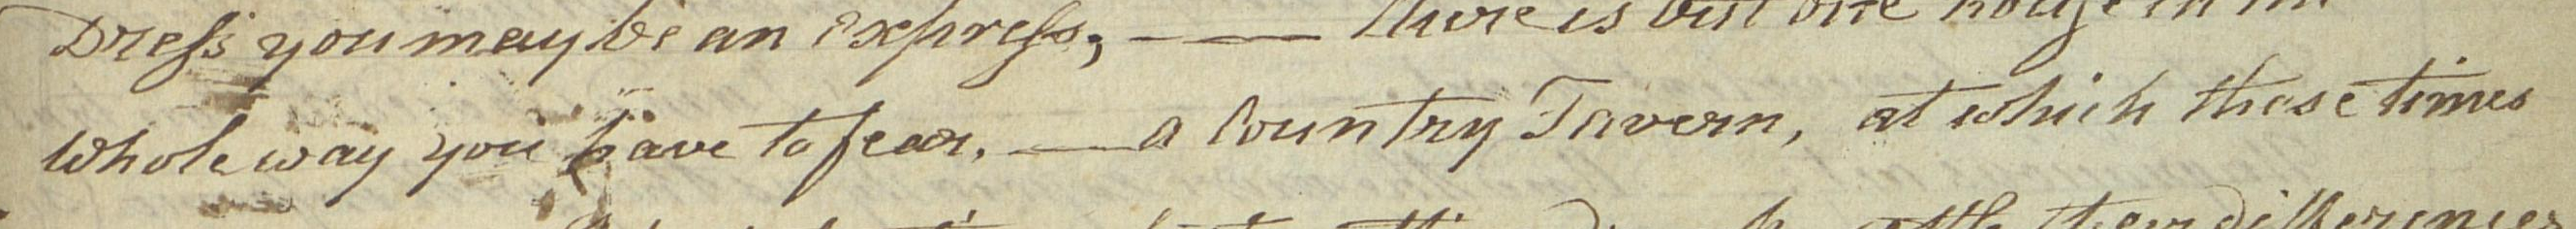whole way you have to fear. A Country Tavern, at which these times
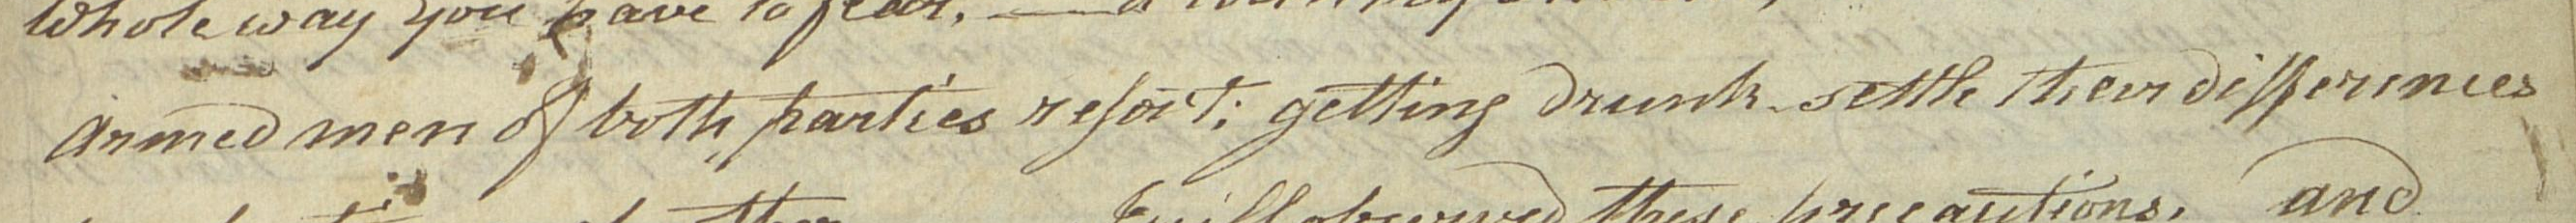armed men of both parties resort getting drunk settle their differences
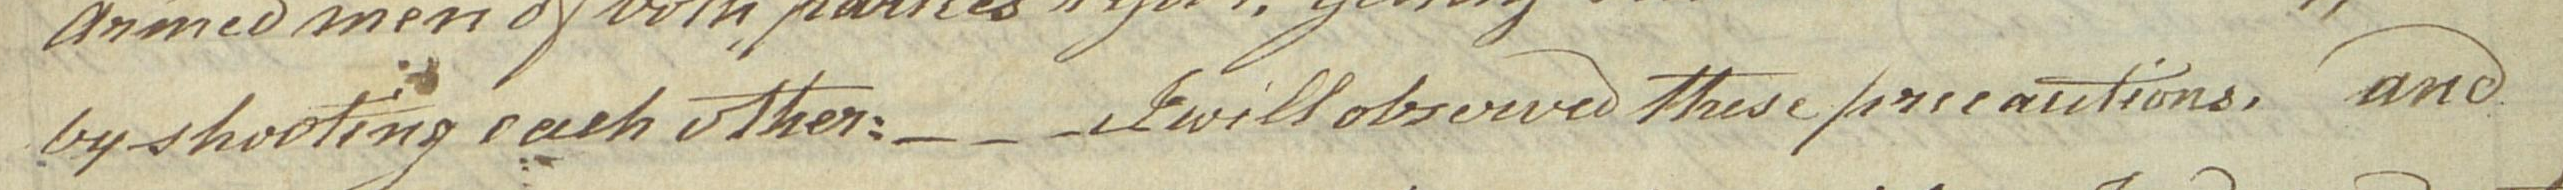by shooting each other: I well observed these precautions, and
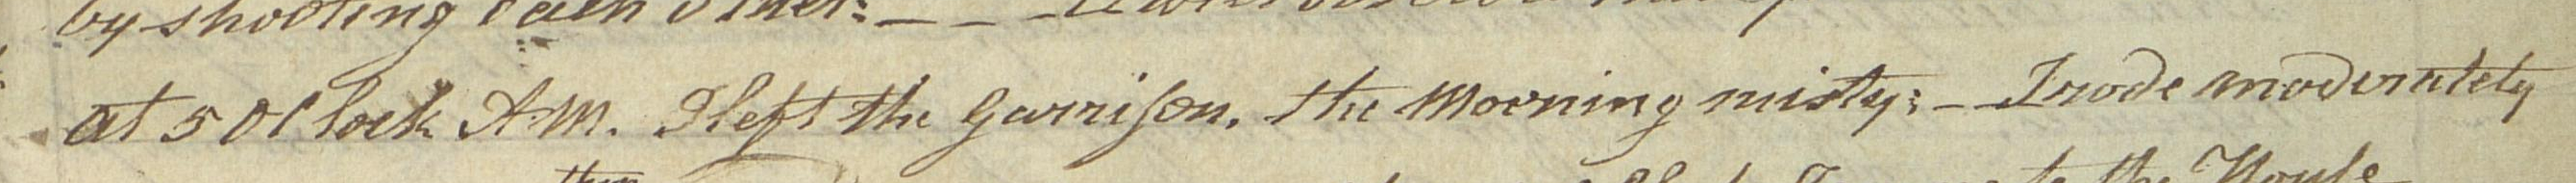at 5 OClock A M. I left the Garrison, the Morning misty; I rode moderately
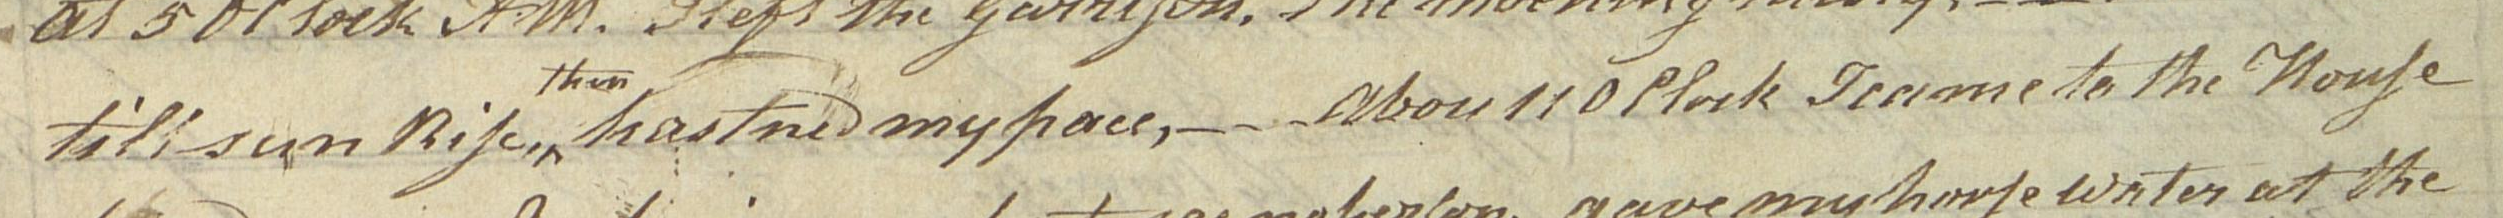till sun Rise, ^ hastned my pace, Abou 11OClock I came to the House
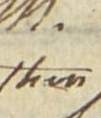them
